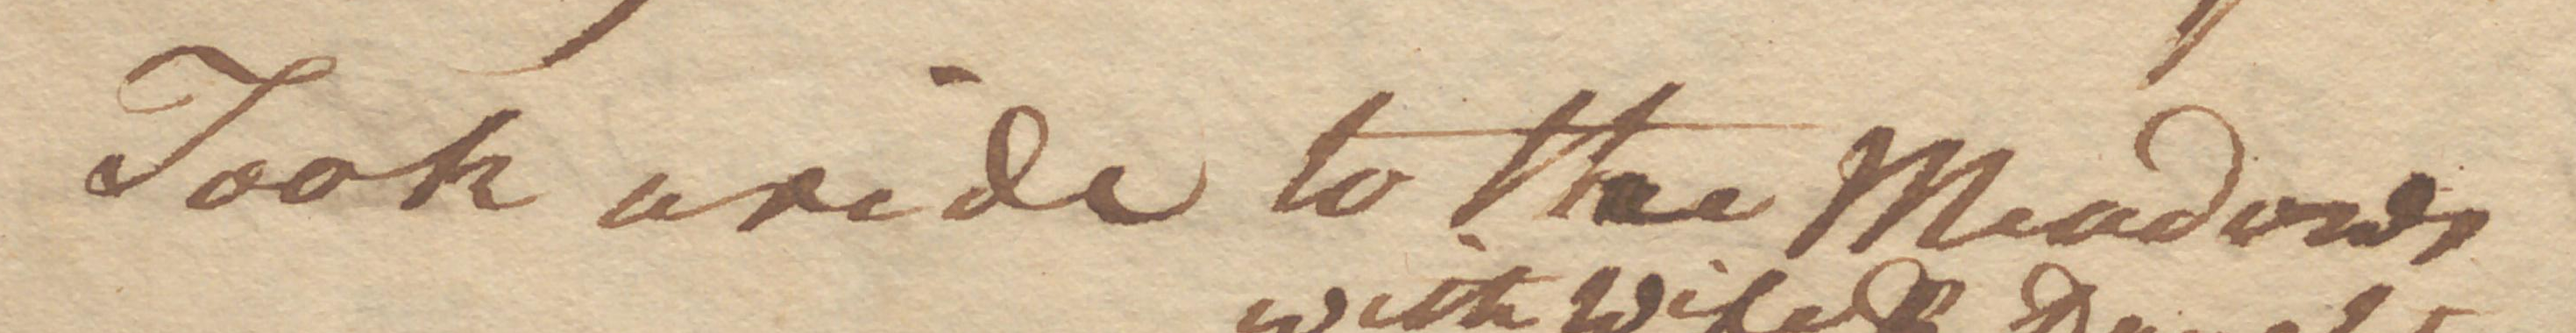Took a ride to the Meadows
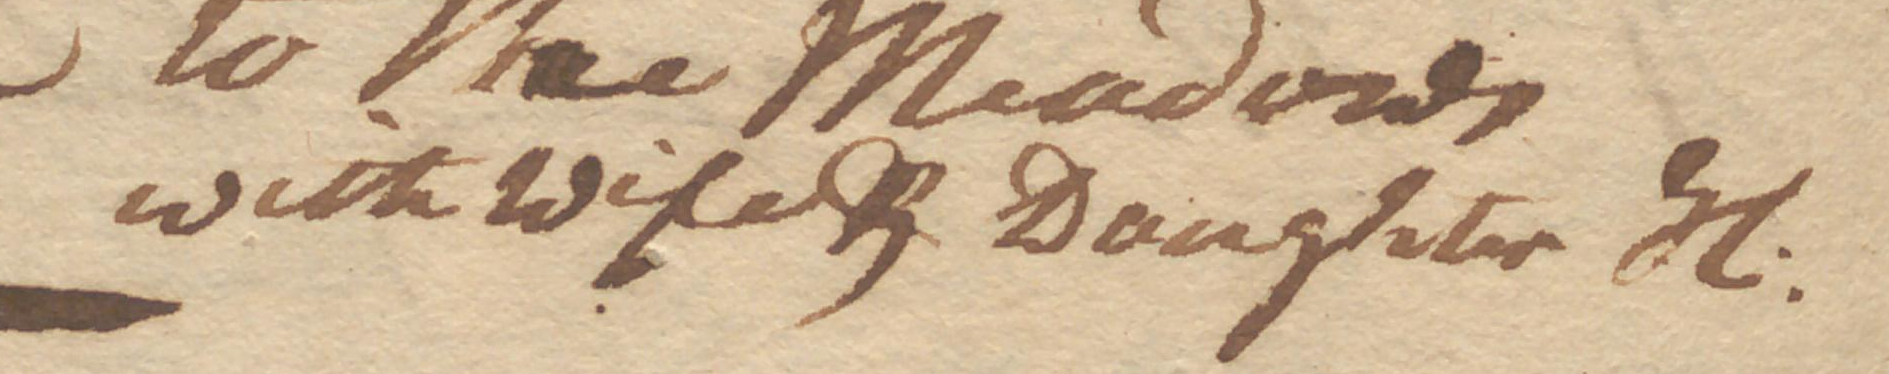with wife & Daughter H.
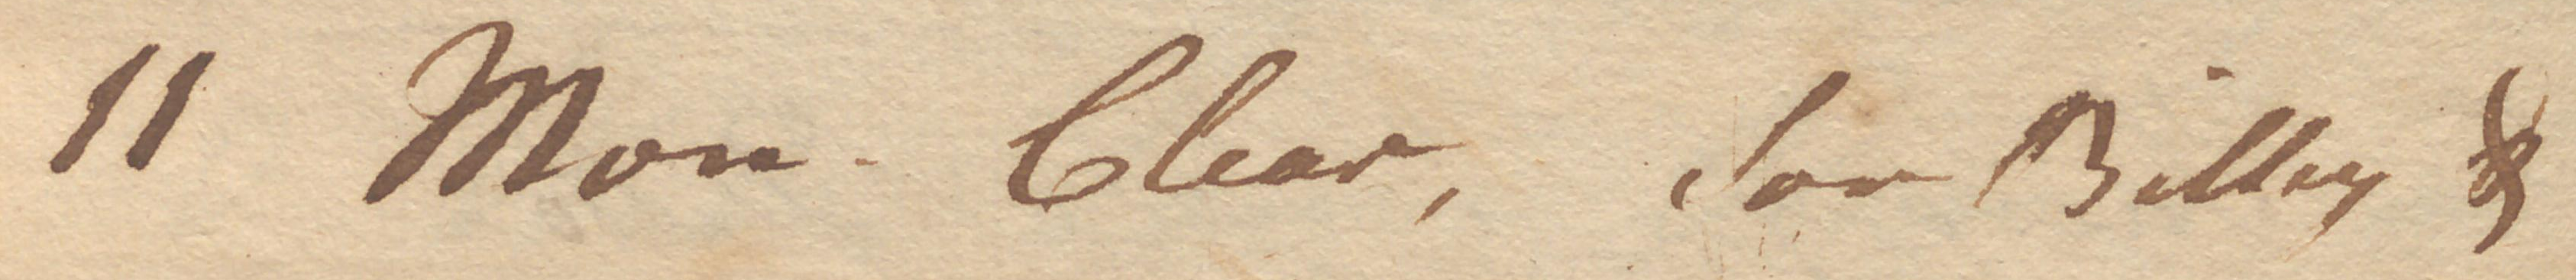11 Mon. Clear, Son Billey &
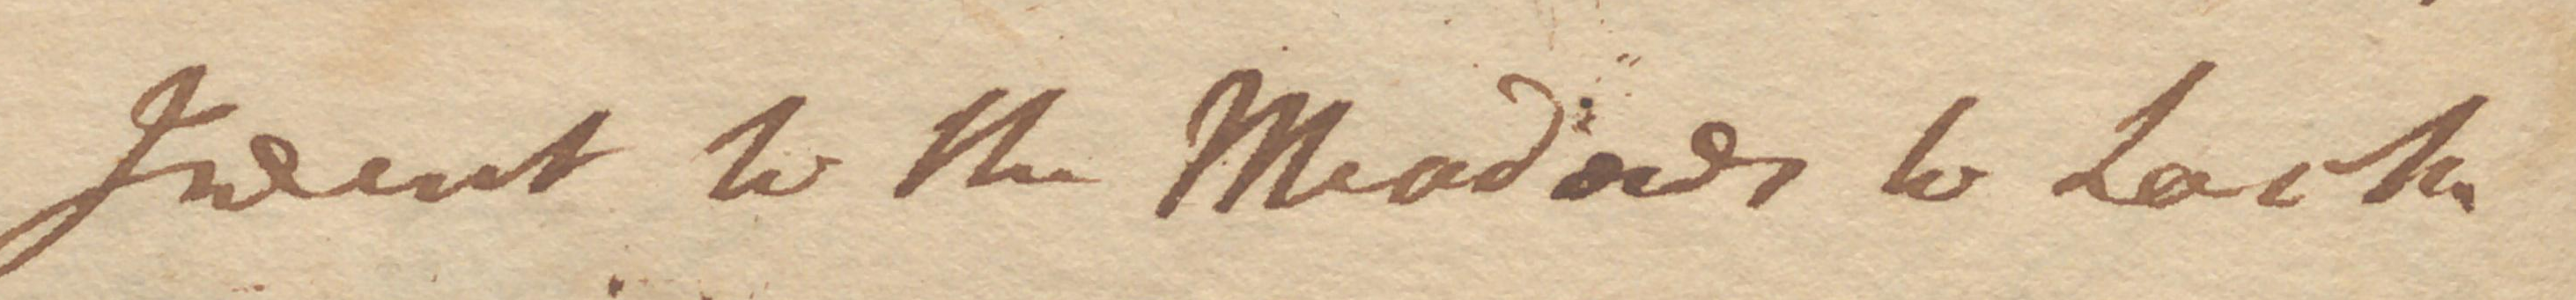I went to the Meadows to Look
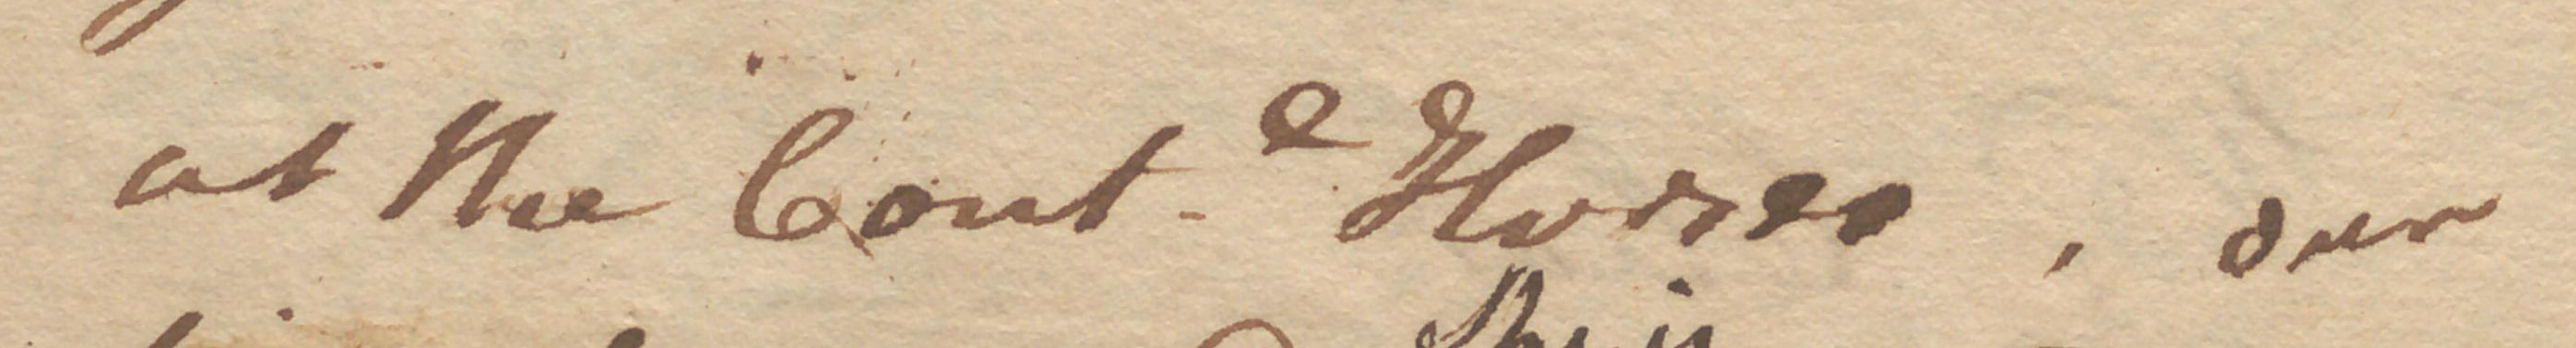at thee Cont^l. Horses, our
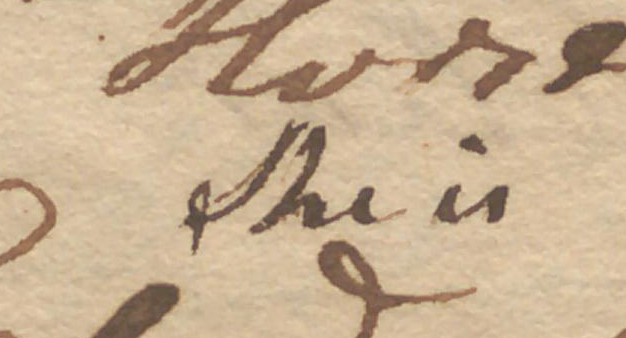She is
